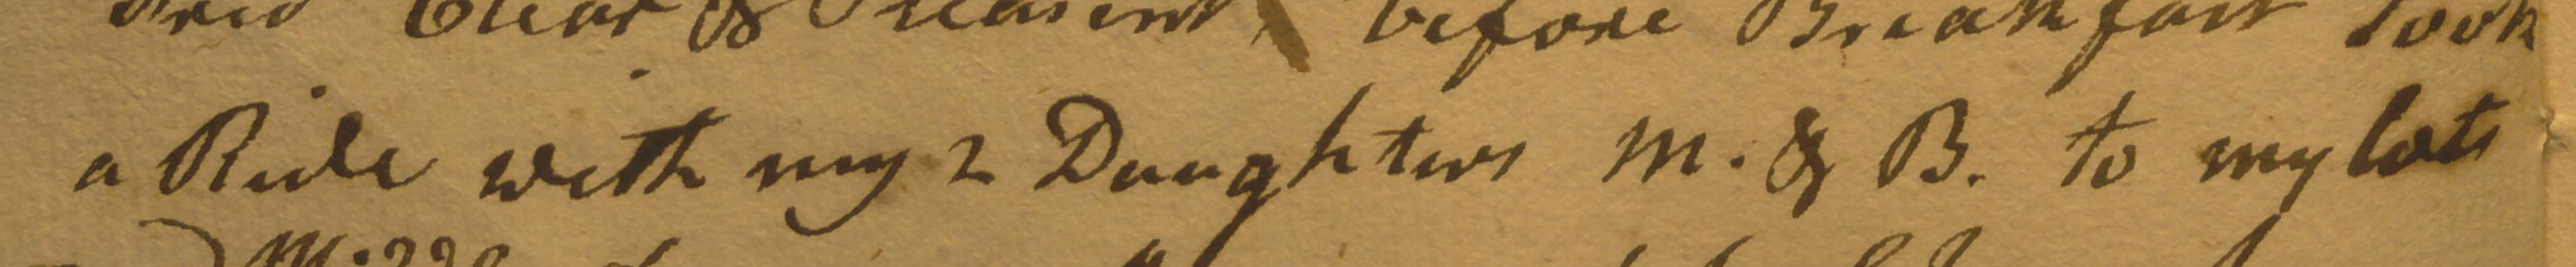a Ride with my 2 Daughters M. & B. to my lots
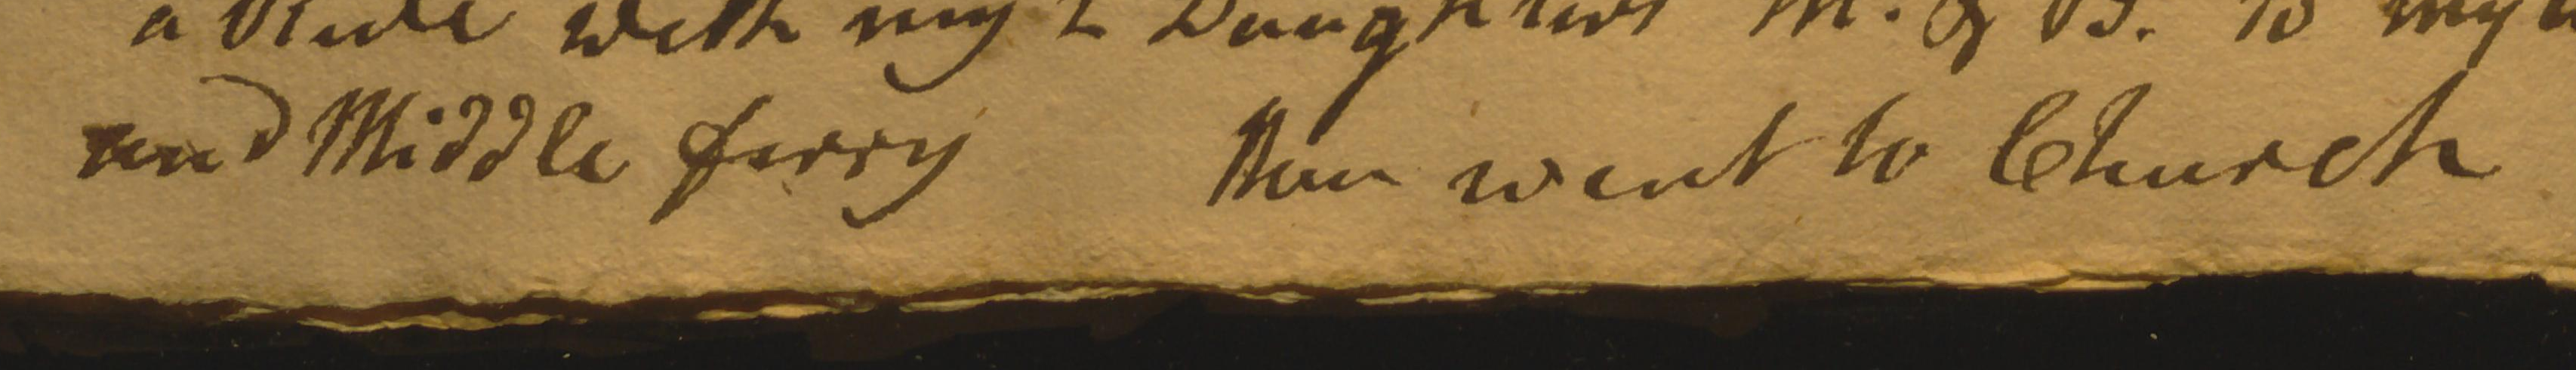and Middle ferry than went to Church
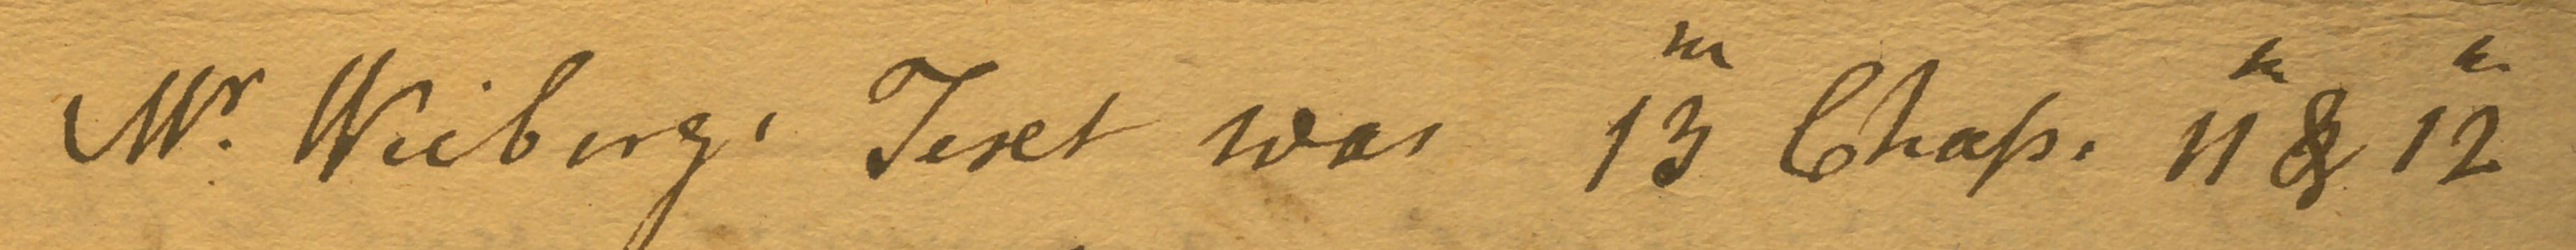M^r. Weibergs Text was 13^th Chap. 11^th & 12^th
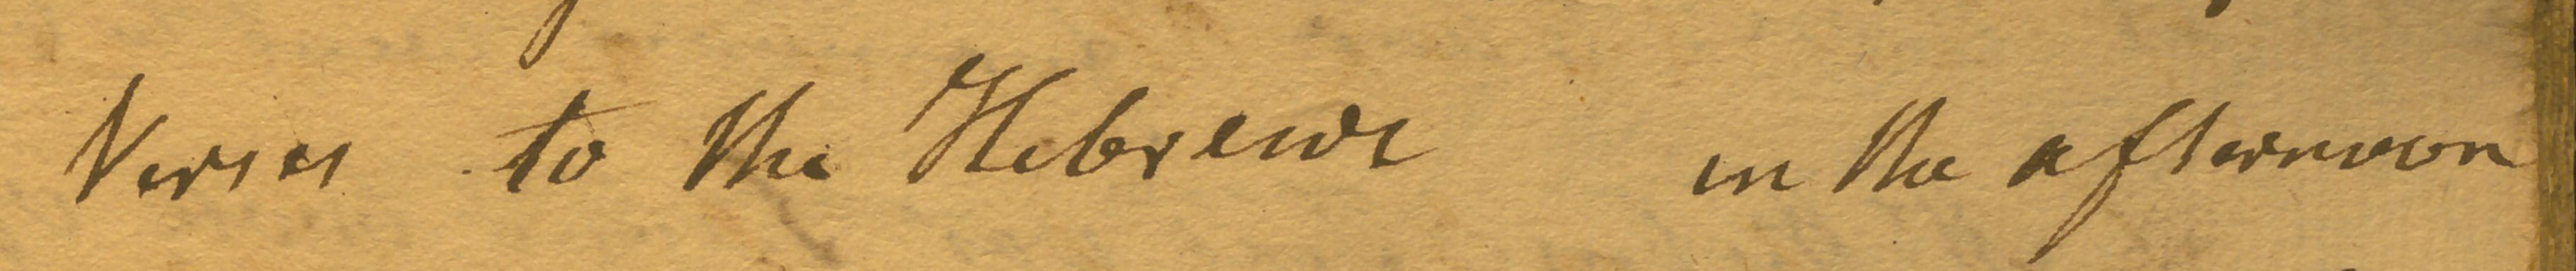Verses to the Hebrews in the afternoon
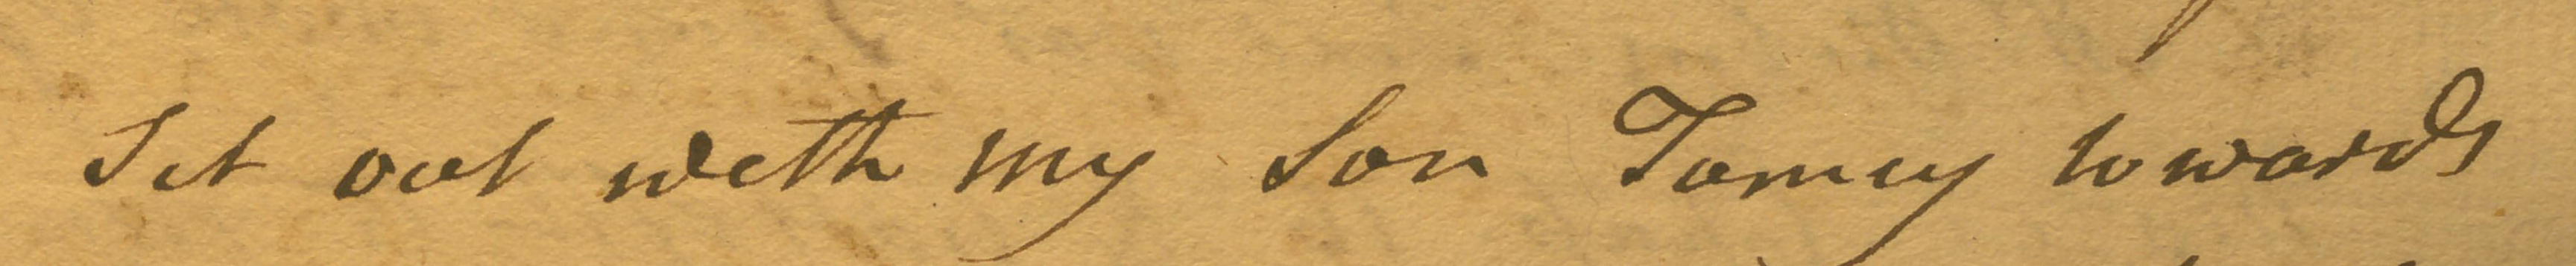set oot with my Son Tomey towards
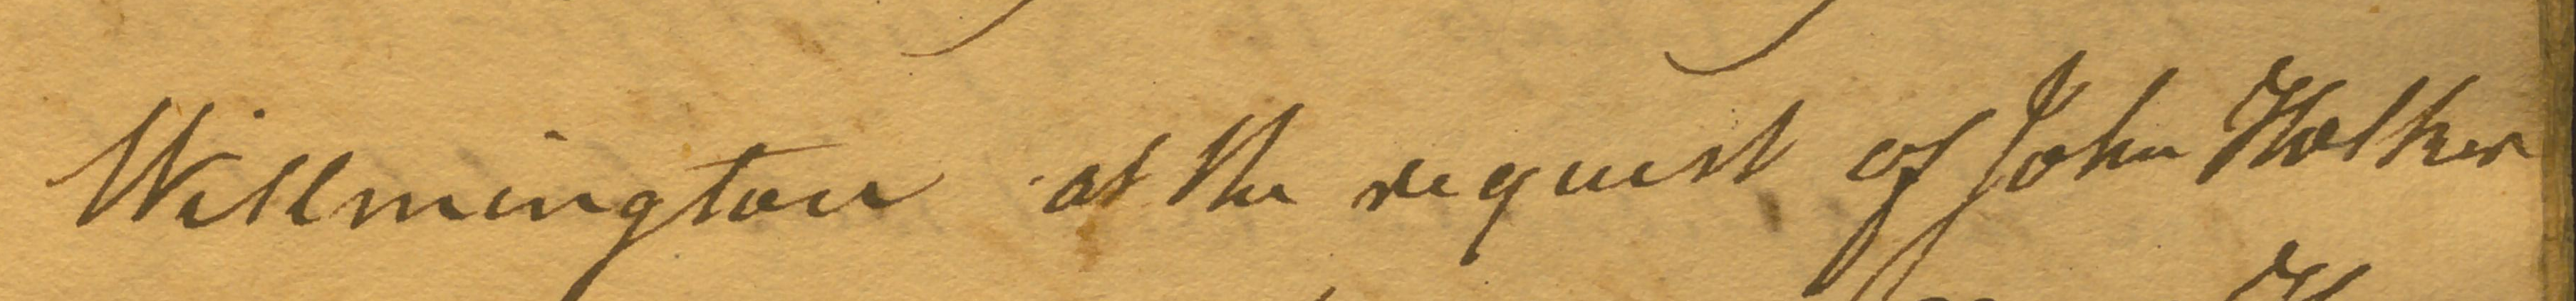Willmington at the request of John Holker
